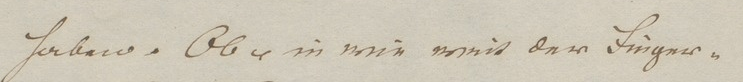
haben. Ob & in wie weit der Finger-
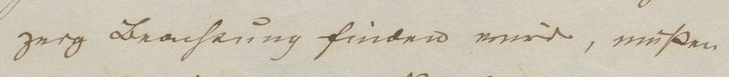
zeig Beachtung finden wird, müßen
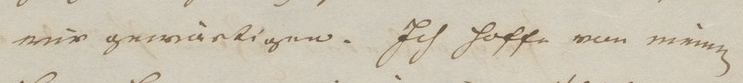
wir gewärtigen. Ich hoffe von meinen
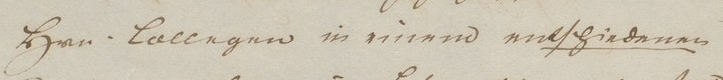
Hrn. Collegen in einem entschiedenen
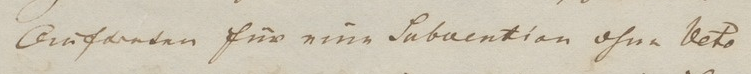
Auftreten für eine Subvention ohne Veto
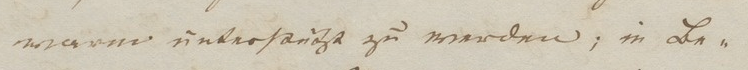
warm unterstützt zu werden; in Be-
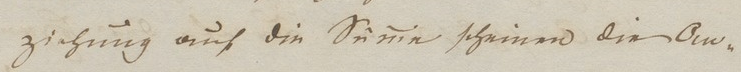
ziehung auf die Summe scheinen die An-
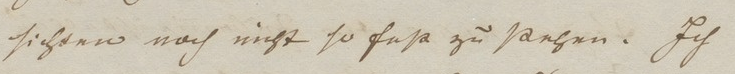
sichten noch nicht so fest zu stehen. Ich
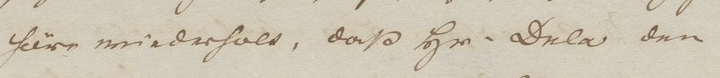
höre wiederholt, daß Hr. Dula den
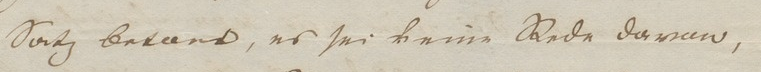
Satz betont, es sei keine Rede davon,
